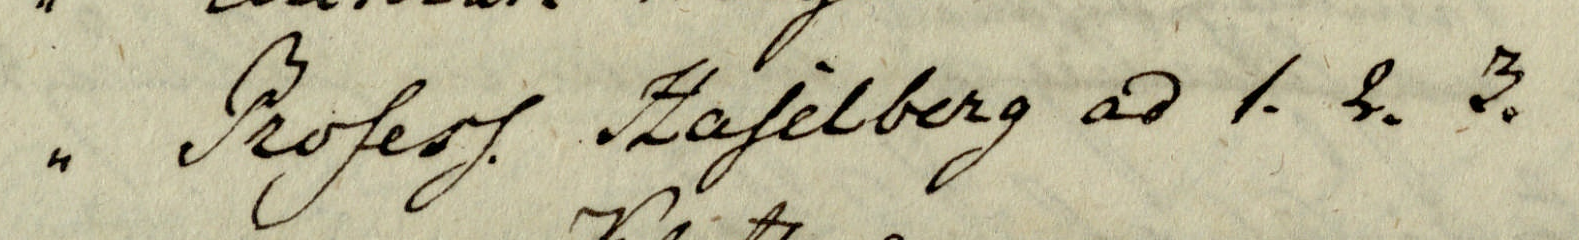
" Profess. Haselberg ad 1. 2. 3.
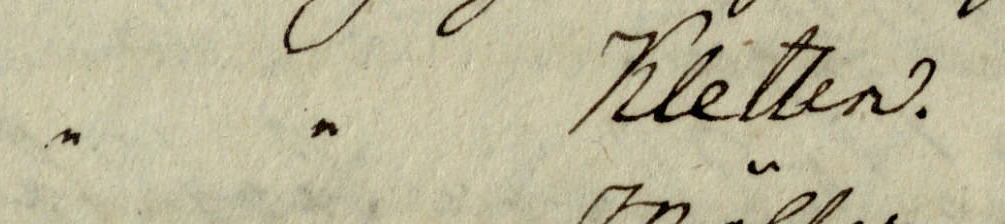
" " Kletten.
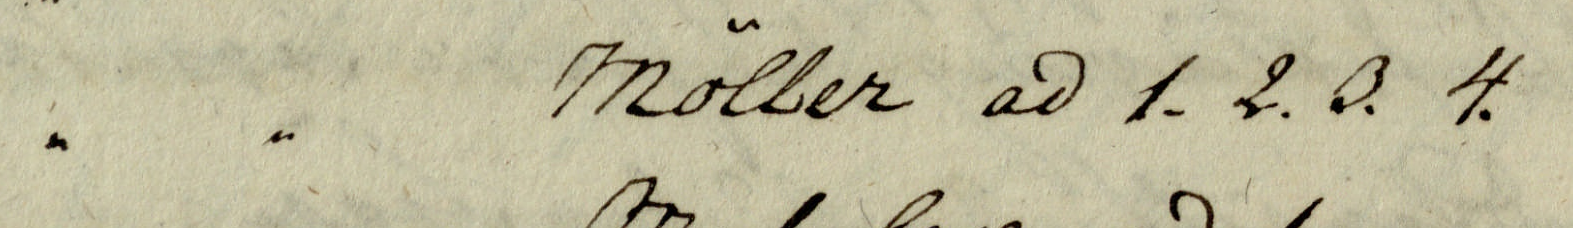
" " Möller ad 1. 2. 3. 4.
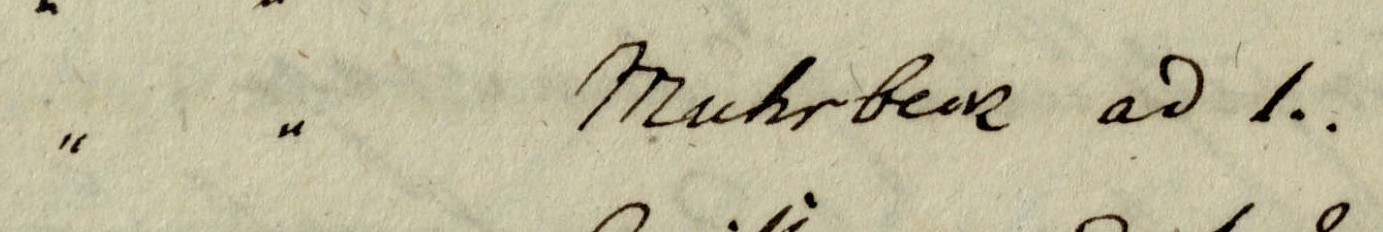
" " Muhrbeck ad 1.
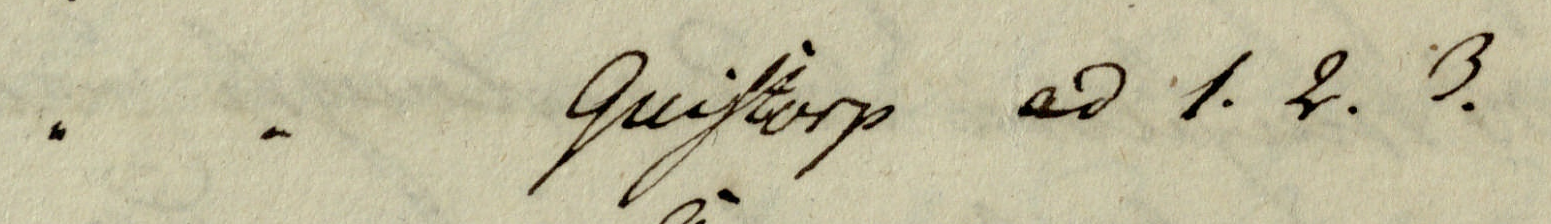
" " Quistorp ad 1. 2. 3.
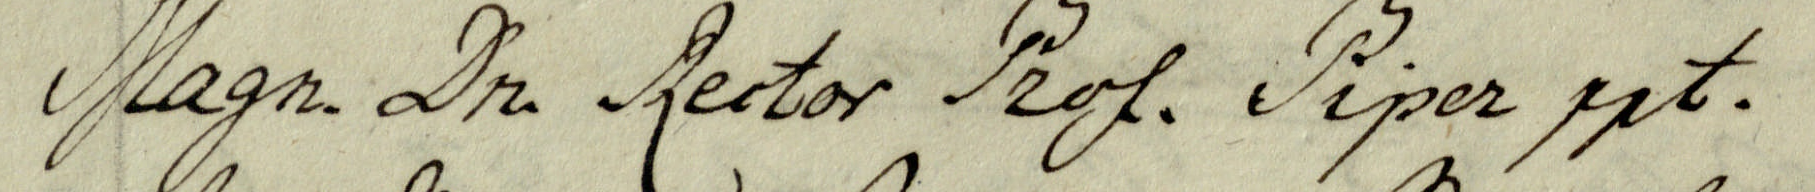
Magn. Dn. Rector Prof. Piper ppt.
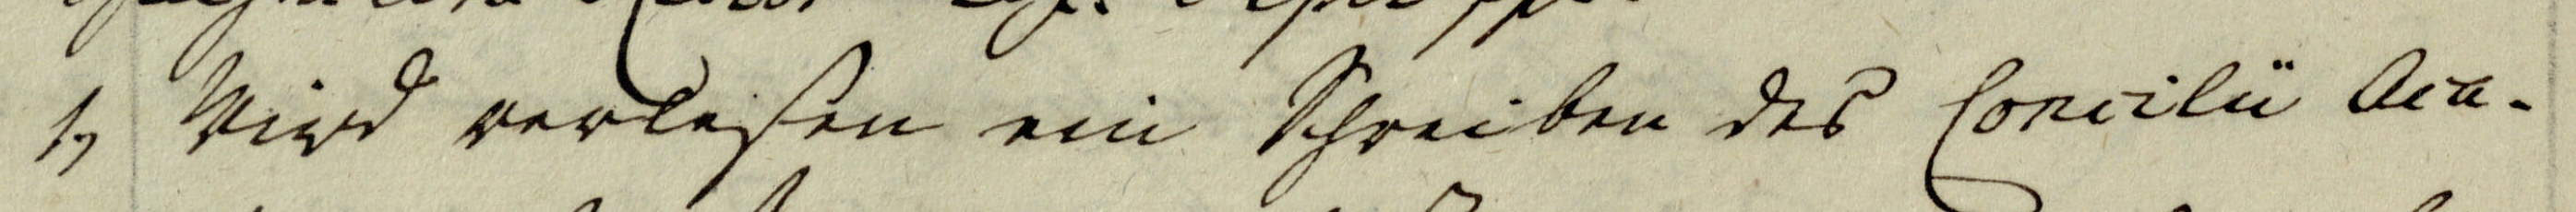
1., Wird verlesen ein Schreiben des Concilii Aca¬
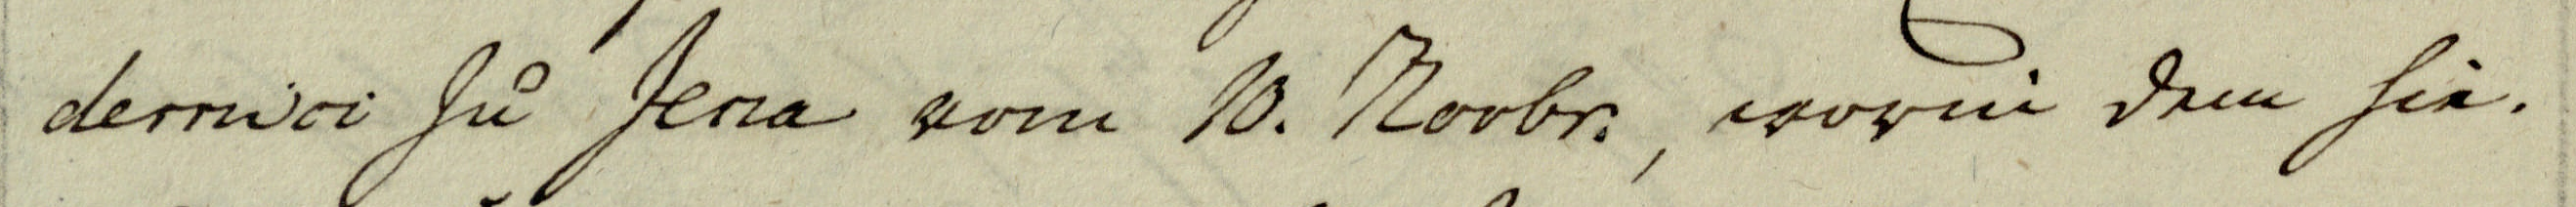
demici zu Jena vom 10. Novbr., worin dem hie¬
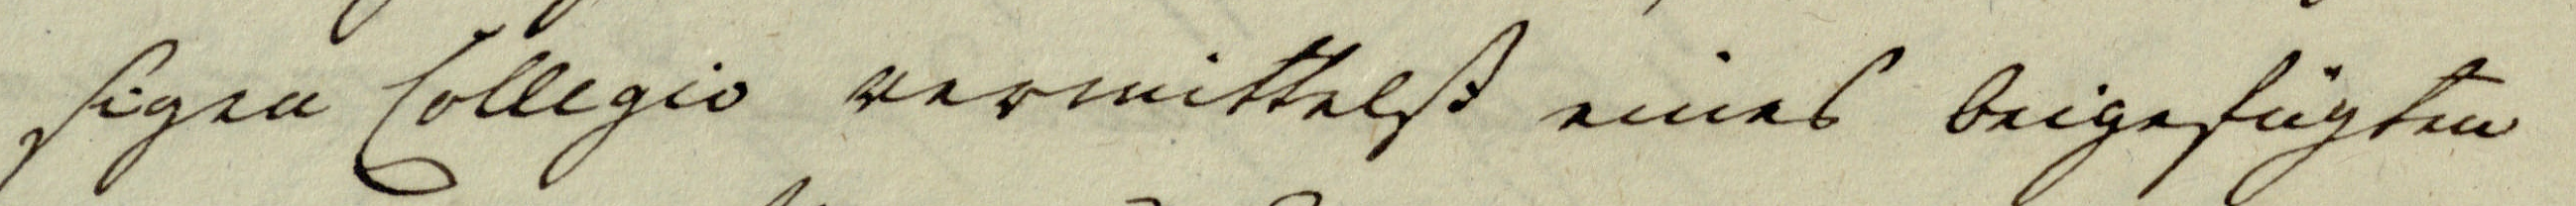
sigen Collegio vermittelß eines beigefügten
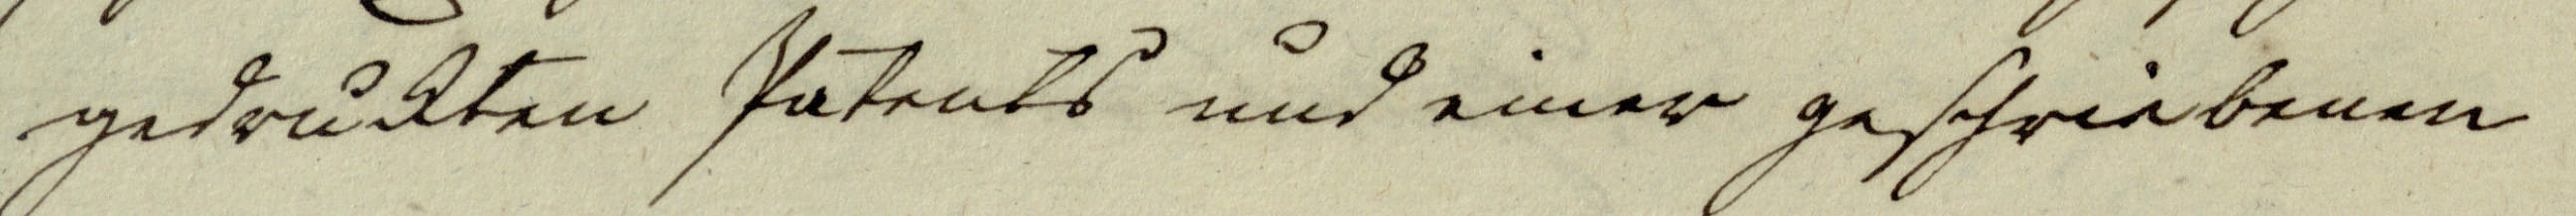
gedruckten Patents und einer geschriebenen
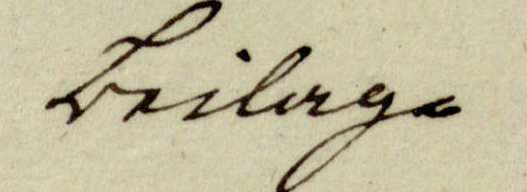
Beilage
